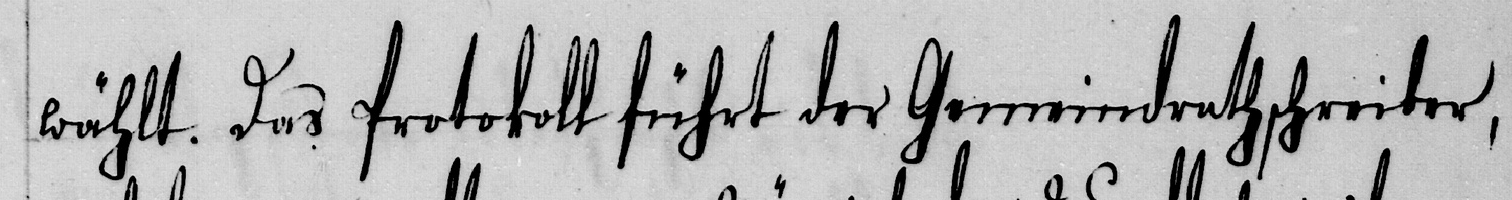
wählt. Das Protokoll führt der Gemeindrathschreiber,
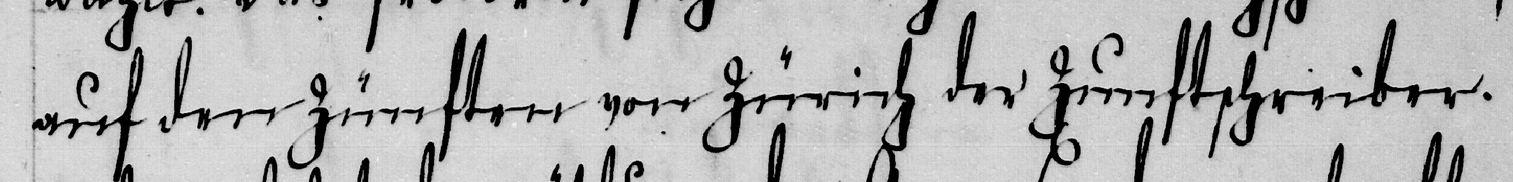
auf den Zünften von Zürich der Zunftschreiber.
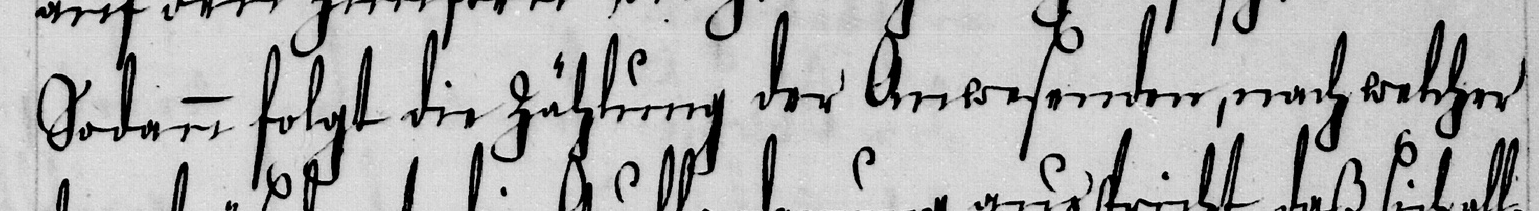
Sodann folgt die Zählung der Anwesenden, nach welcher
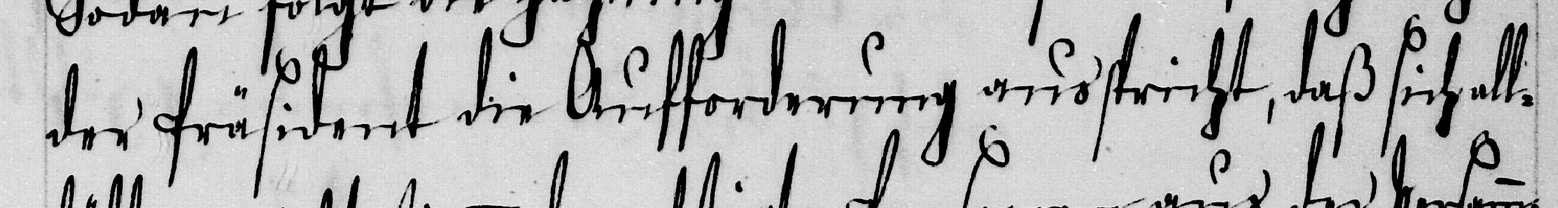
der Präsident die Aufforderung ausspricht, daß sich a¬
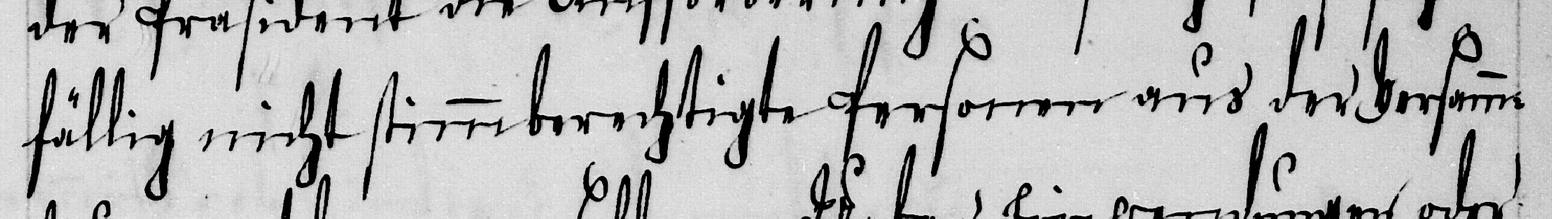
fällig nicht stimmberechtigte Personen aus der Versam¬
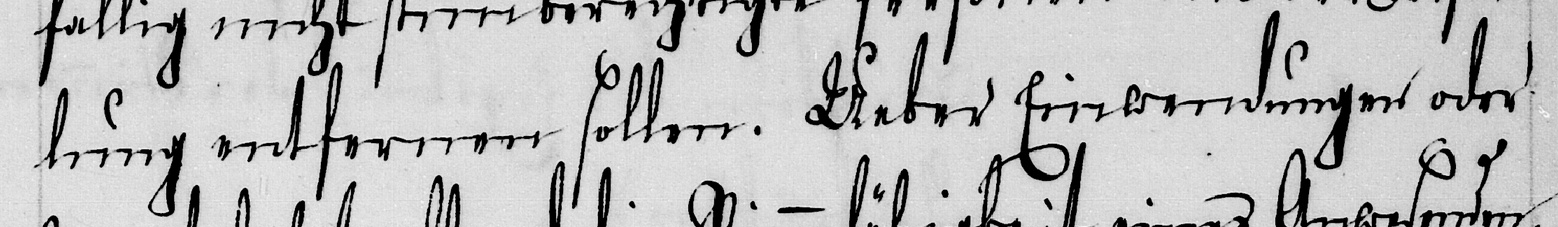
mlung entfernen sollen. Ueber Einwendungen oder
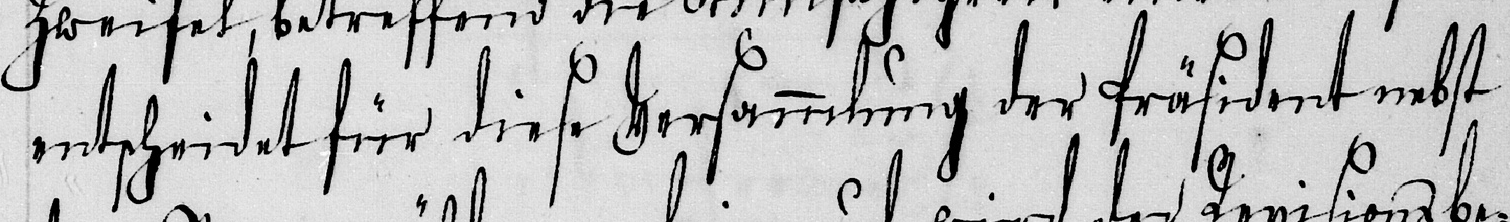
entscheidet für diese Versammlung der Präsident nebst
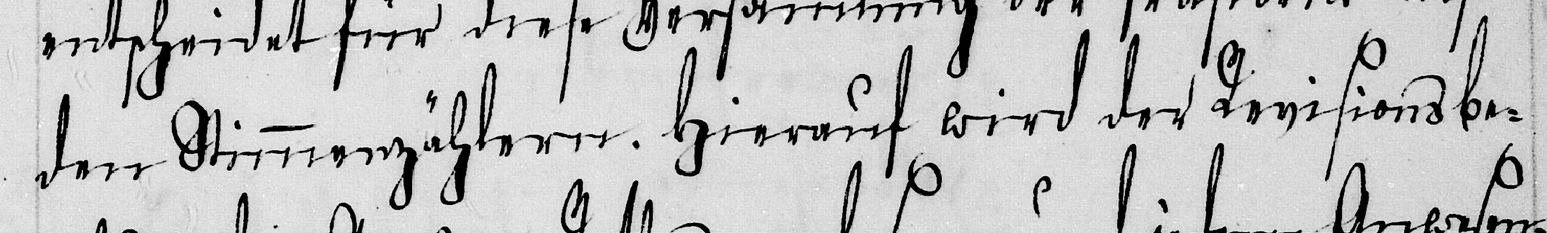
den Stimmenzählern. Hierauf wird der Revisionsbe¬
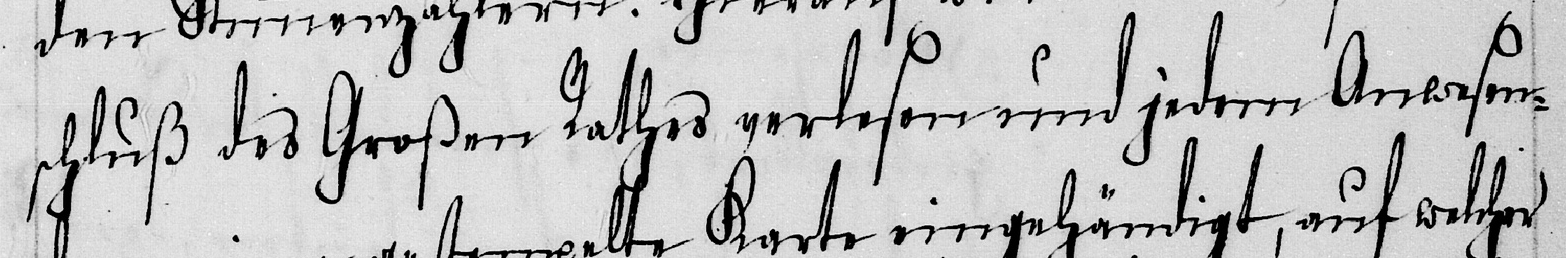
schluß des Großen Rathes verlesen und jedem Anwesen¬
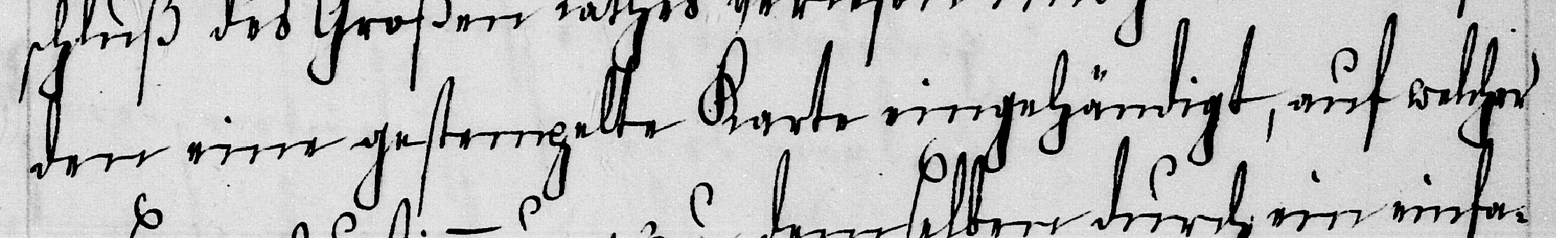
den eine gestempelte Karte eingehändigt, auf welcher
